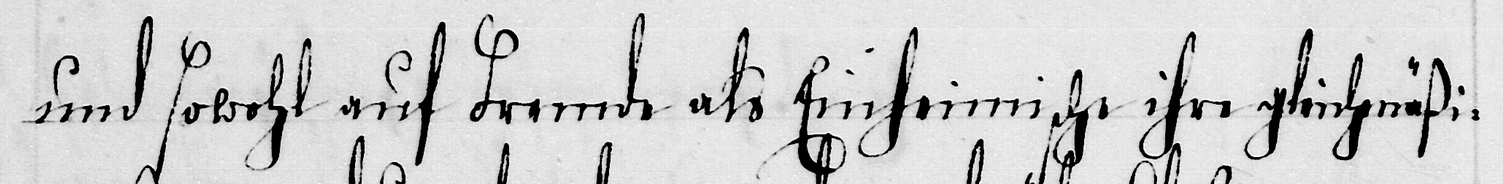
und sowohl auf Fremde als Einheimische ihre gleichmäß¬
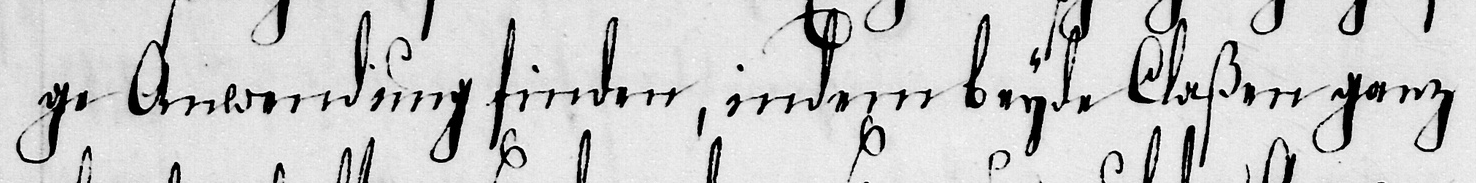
ige Anwendung finden, indem beyde Claßen ganz
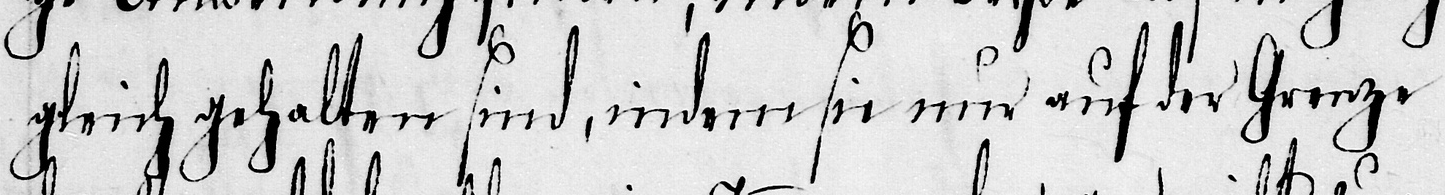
gleich gehalten sind, indem sie nur auf der Grenze
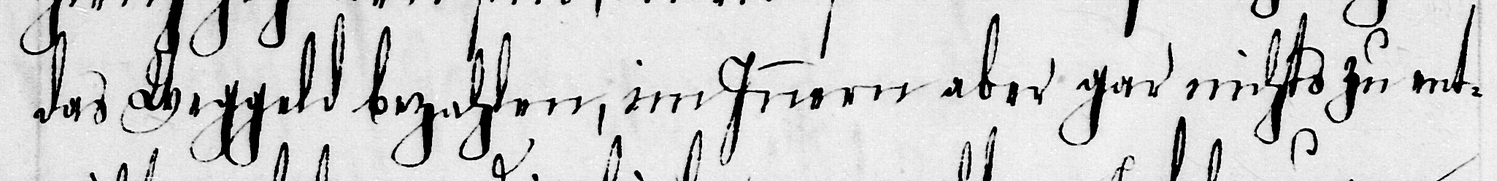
das Weggeld bezahlen, im Innern aber gar nichts zu ent¬
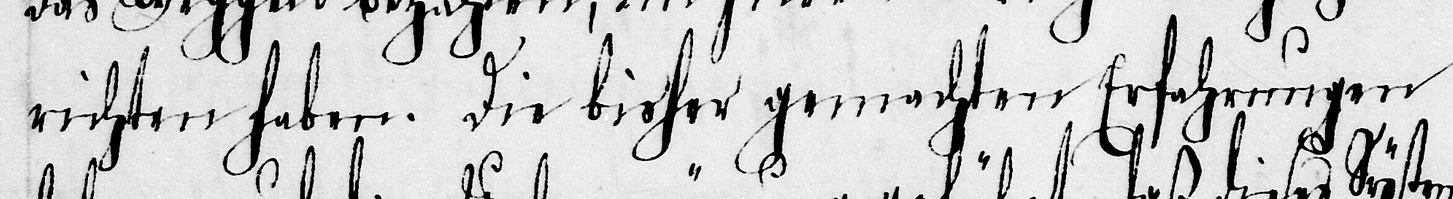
richten haben. Die bisher gemachten Erfahrungen
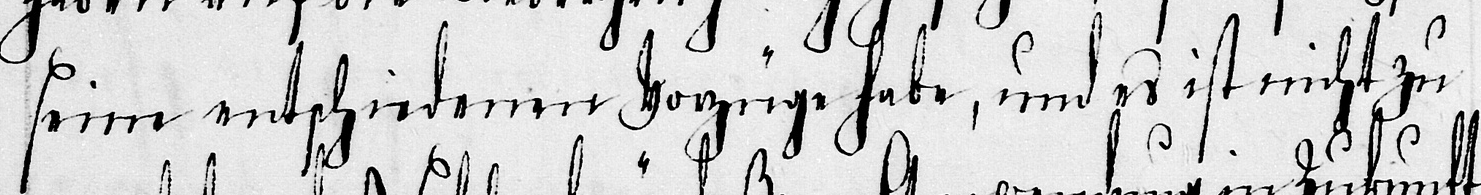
seine entschiedenen Vorzüge habe, und es ist nicht zu
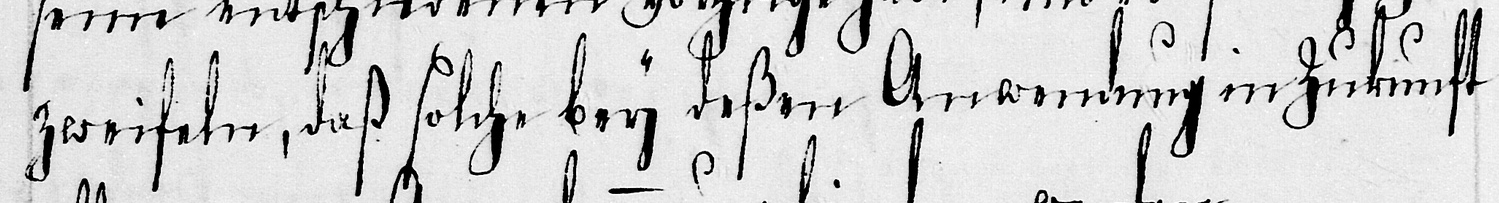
zweifeln, daß solche bey deßen Anwendung in Zukunft
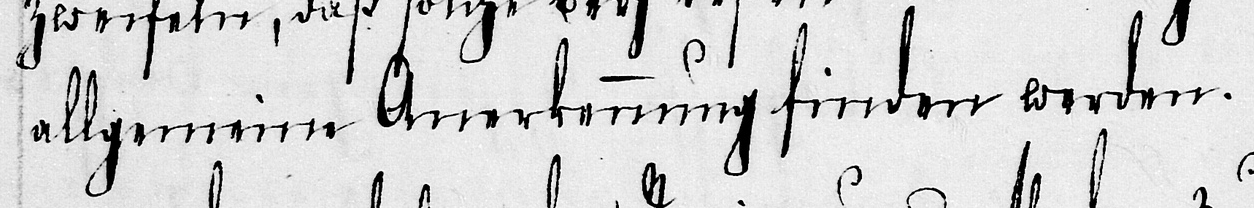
allgemeine Anerkennung finden werden.
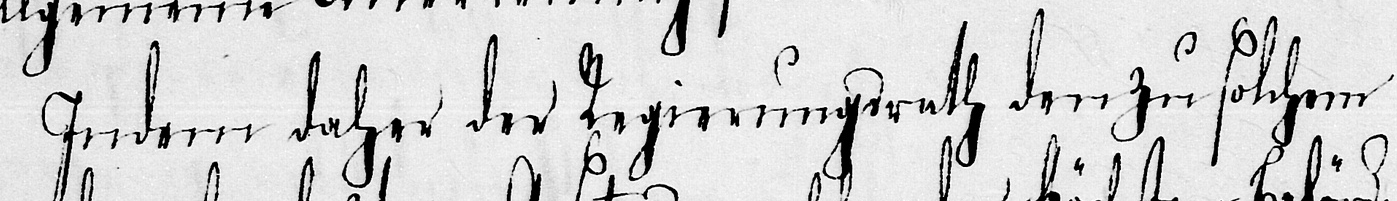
Indem daher der Regierungsrath den zu solchem
